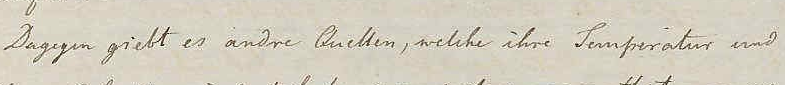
Dagegen giebt es andre Quellen, welche ihre Temperatur und
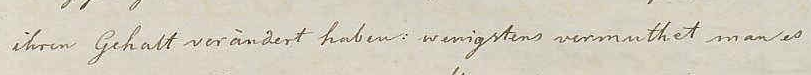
ihren Gehalt verändert haben: wenigstens vermuthet man es
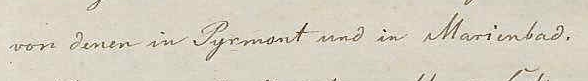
von denen in Pyrmont und in Marienbad.
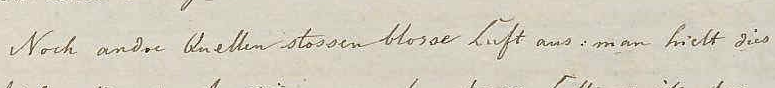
Noch andre Quellen stossen blosse Luft aus: man hielt dies
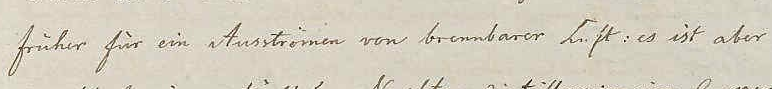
früher für ein Ausströmen von brennbarer Luft: es ist aber
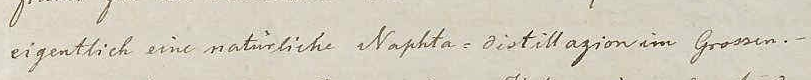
eigentlich eine natürliche Naphta-distillazion im Grossen. –
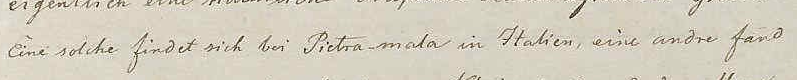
Eine solche findet sich bei Pietra-mala in Italien, eine andre fand
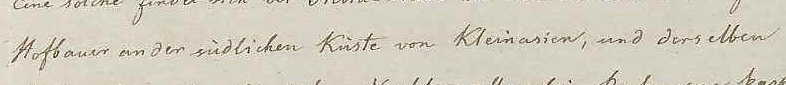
Hofbauer an der südlichen Küste von Kleinasien, und derselben
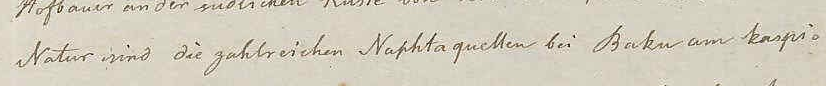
Natur sind die zahlreichen Naphtaquellen bei Baku am kaspi-
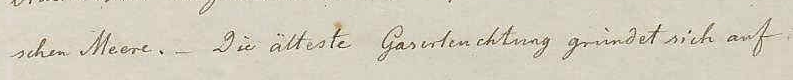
schen Meere. – Die älteste Gaserleuchtung gründet sich auf
